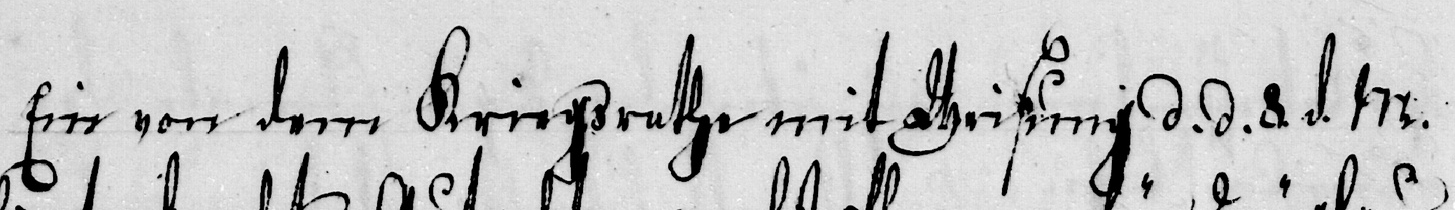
Ein von dem Kriegsrathe mit Weisung d. d. 8. d. M.
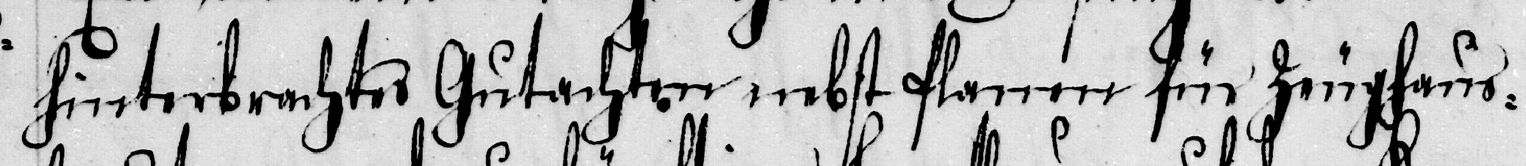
hinterbrachtes Gutachten nebst Planen für Zeughaus¬
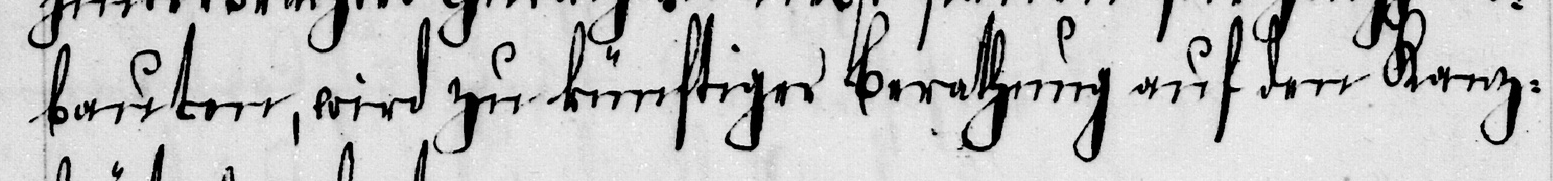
bauten, wird zu künftiger Berathung auf den Kanz¬
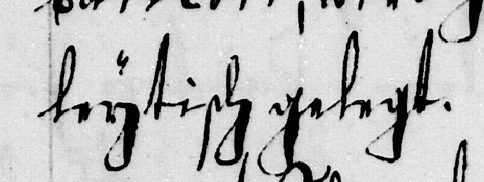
leytisch gelegt.
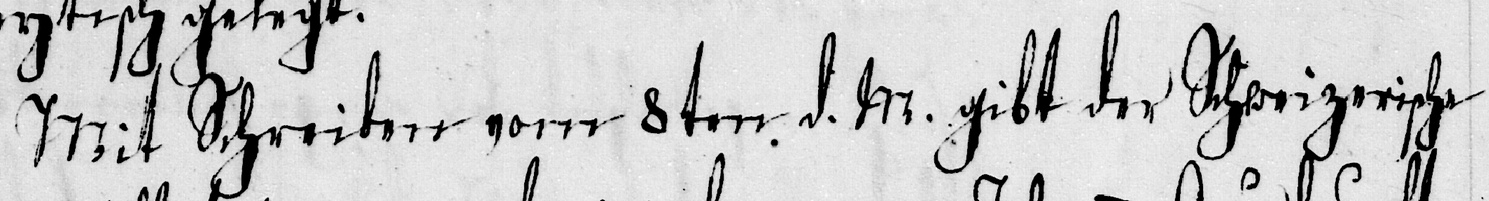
Mit Schreiben vom 8ten d. M. gibt der Schweizerische
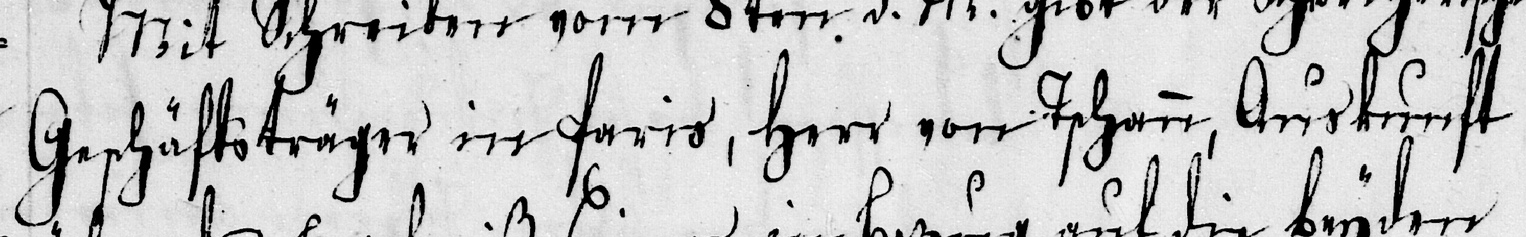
Geschäftsträger in Paris, Herr von Tschann, Auskunft
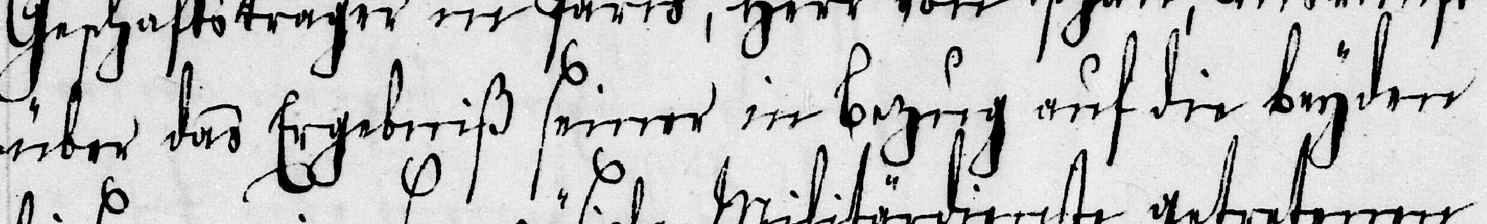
über das Ergebniß seiner in Bezug auf die beyden
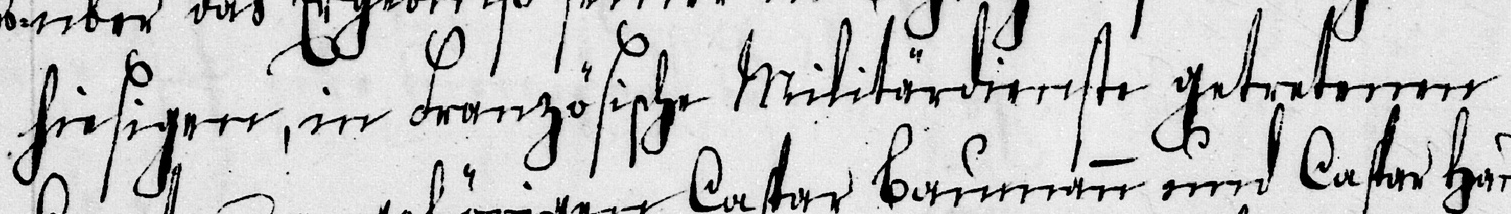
hiesigen, in Französische Militärdienste getretenen
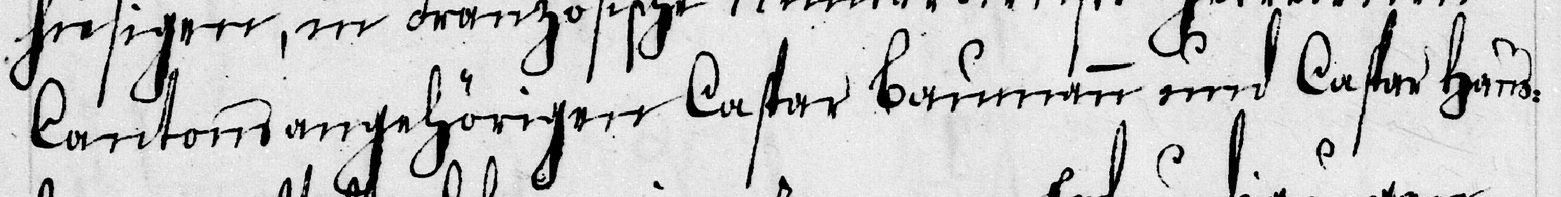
Cantonsangehörigen Caspar Baumann und Caspar Haus¬
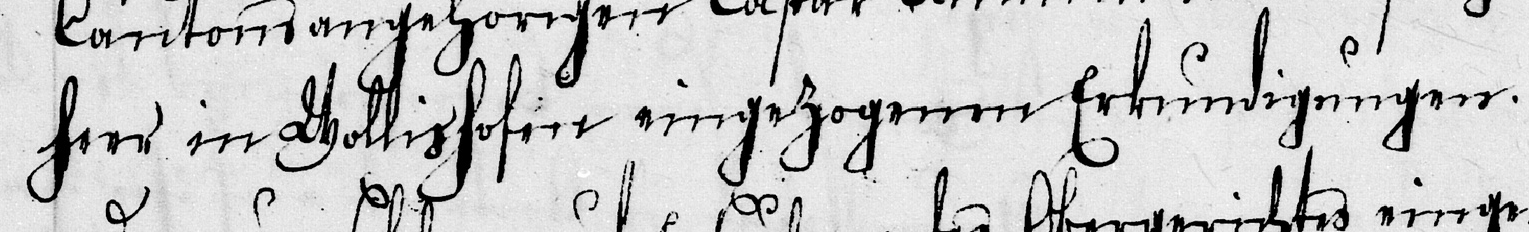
heer in Wollishofen eingezogenen Erkundigungen.
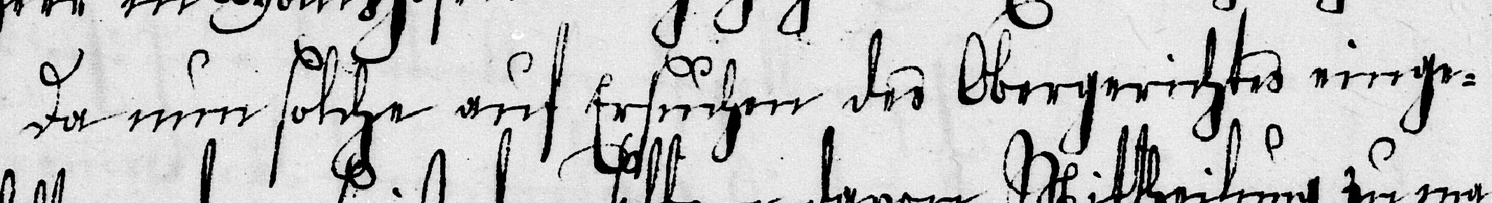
Da nun solche auf Ersuchen des Obergerichtes einge¬
